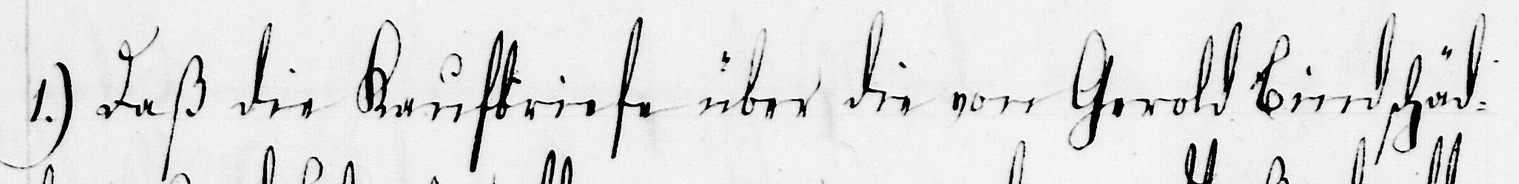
1.) Daß die Kaufbriefe über die von Gerold Bindschäd¬
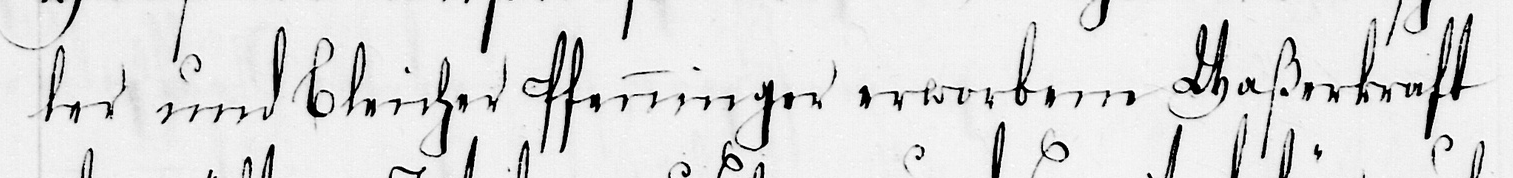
ler und Bleicher Pfenninger erworbene Waßerkraft
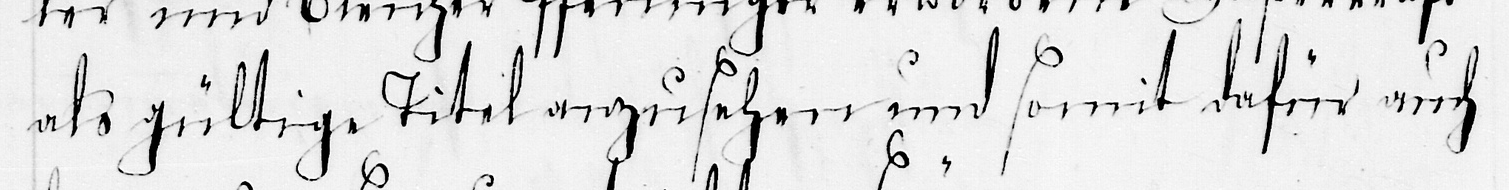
als gültige Titel anzusehen und somit dafür auch
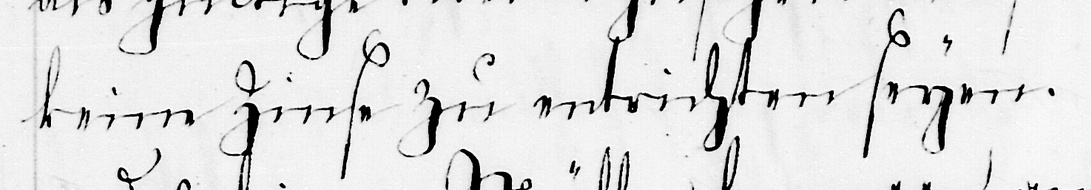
keine Zinse zu entrichten seyen.
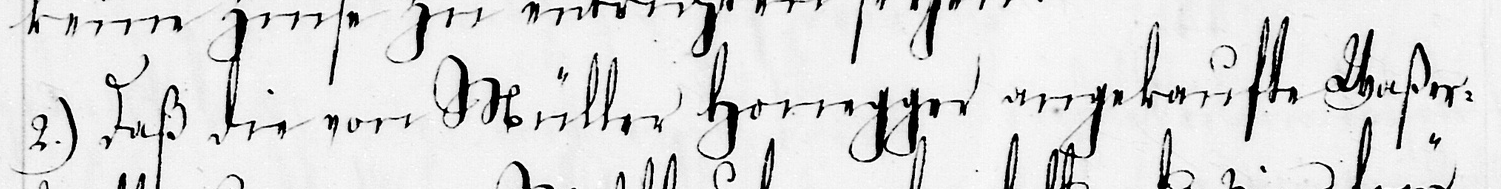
2.) Daß die von Müller Honegger angekaufte Waßer¬
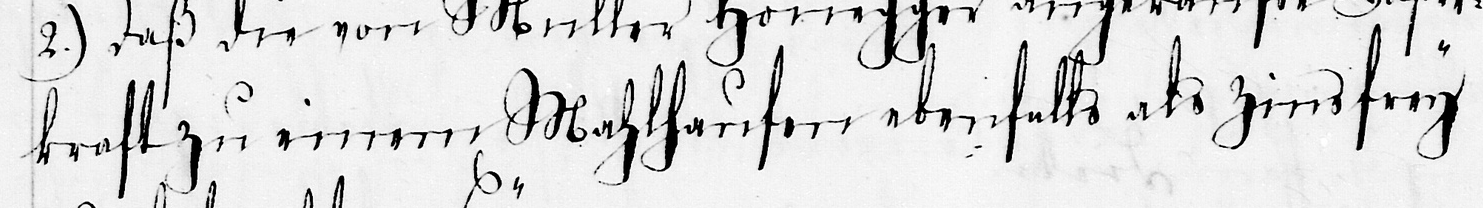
kraft zu einem Mahlhaufen ebenfalls als zinsfrey
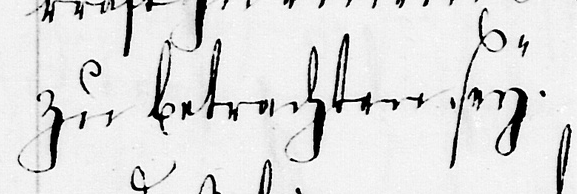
zu betrachten sey.
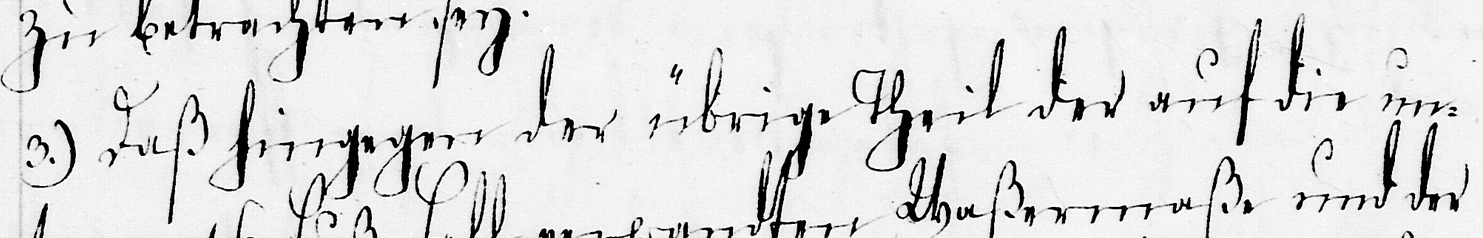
3.) Daß hingegen der übrige Theil der auf die un¬
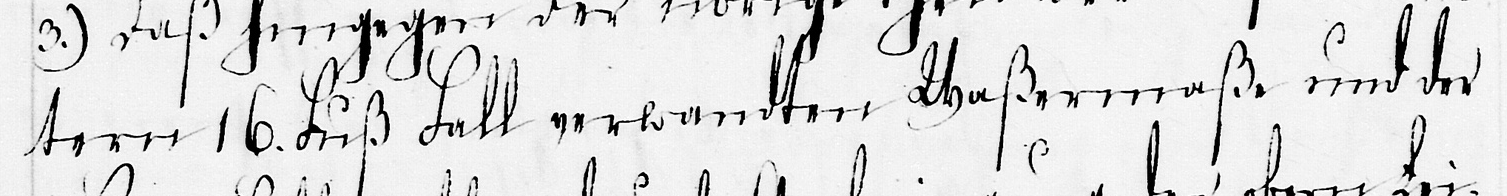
tern 16. Fuß Fall verwandten Waßermaße und der
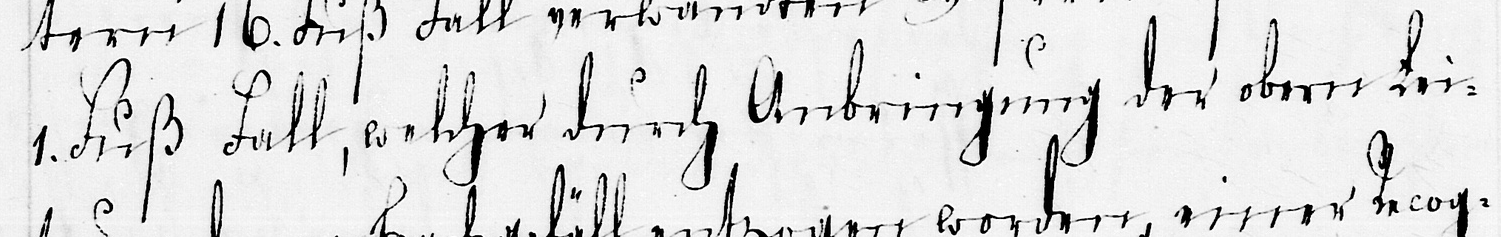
1. Fuß Fall, welcher durch Anbringung der obern Lei¬
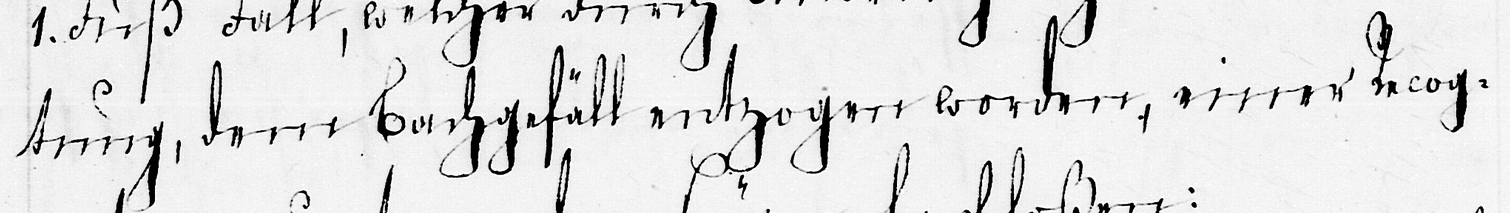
tung, dem Bachgefäll entzogen worden, einer Recog¬
